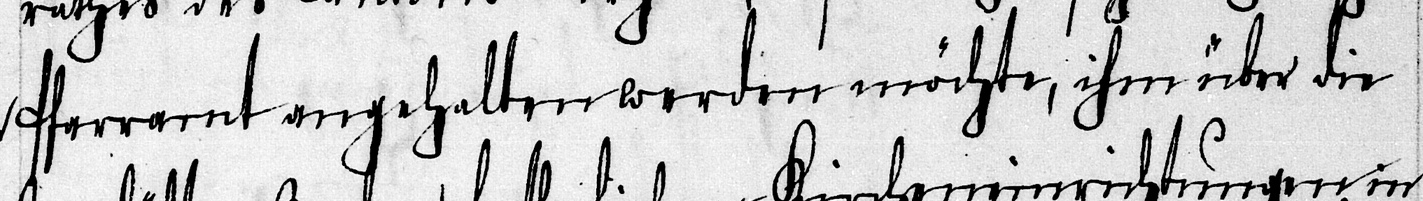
Pfarramt angehalten werden möchte, ihm über die
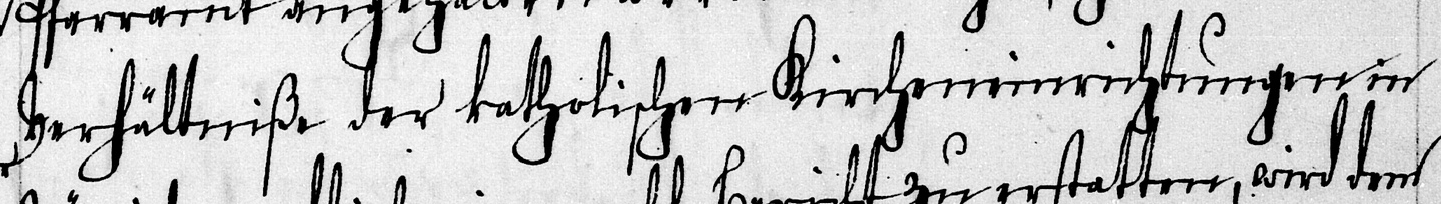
Verhältniße der katholischen Kircheneinrichtungen in
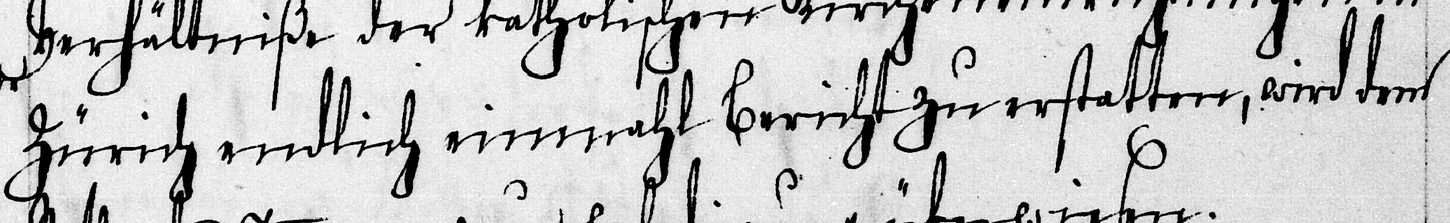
Zürich endlich einmahl Bericht zu erstatten, wird dem
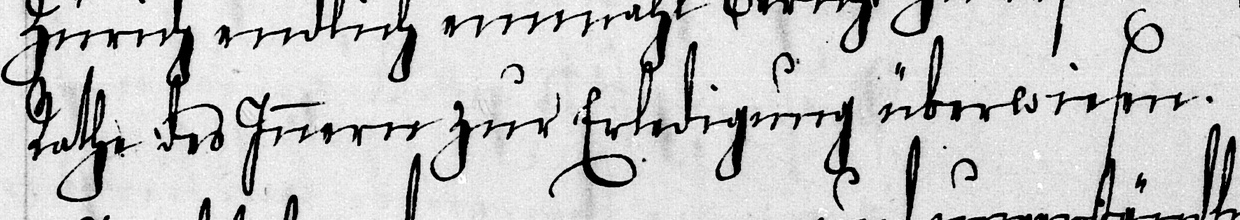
Rathe des Innern zur Erledigung überwiesen.
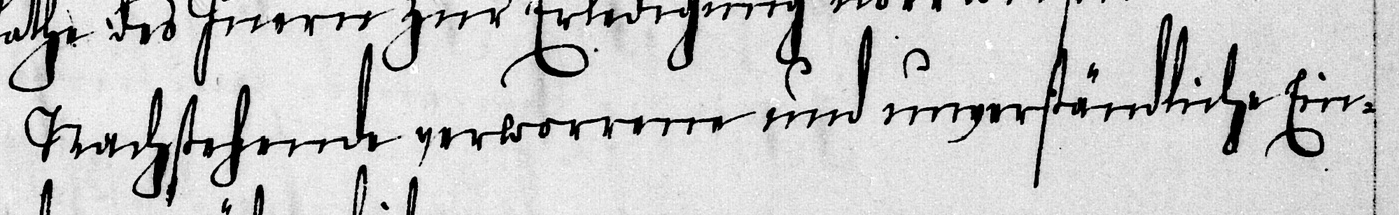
Nachstehende verworrene und unverständliche ein¬
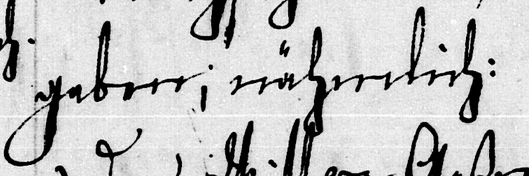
gaben, nähmlich:
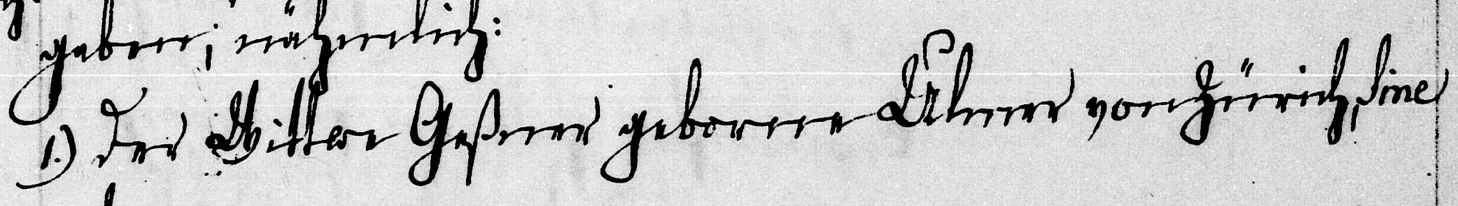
1.) Der Wittwe Geßner geborne Ulmer von Zürich, sine
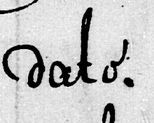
dato.
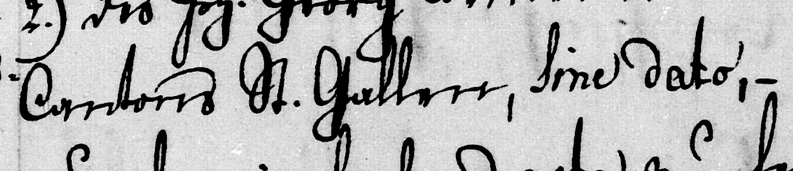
Cantons St. Gallen, Sine dato, –
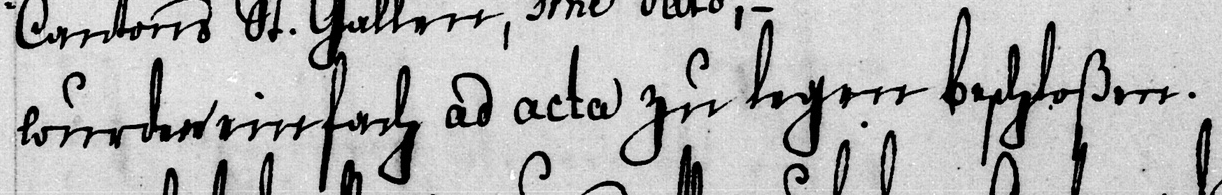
wurden einfach ad acta zu legen beschloßen.
